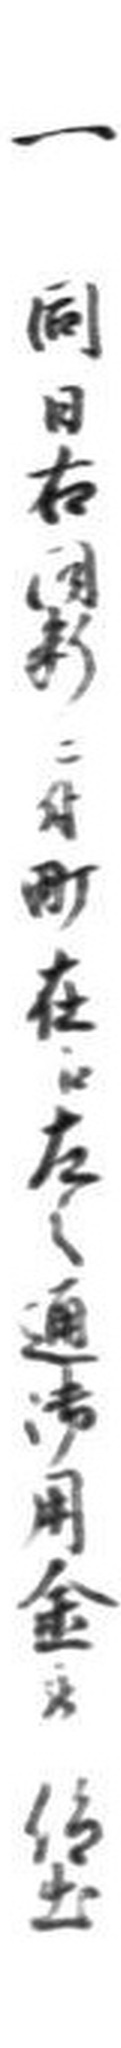一同日右同断ニ付町在江左之通御用金被仰出
